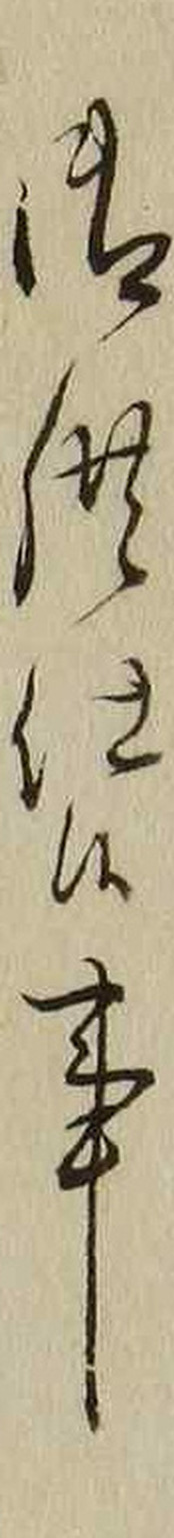御供仕候事
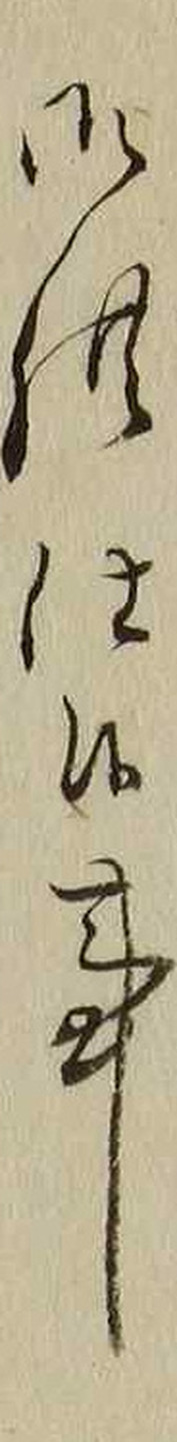御供仕候事
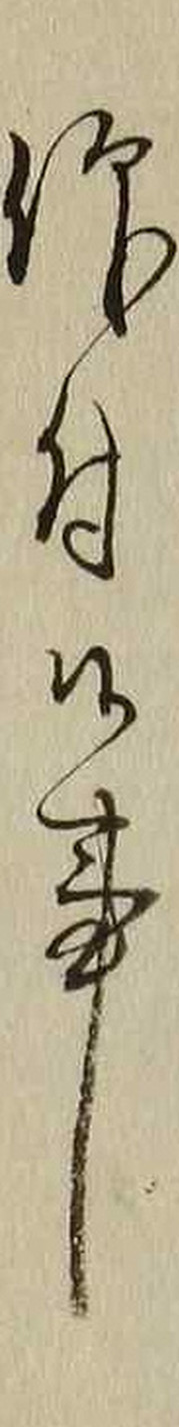仰付候事
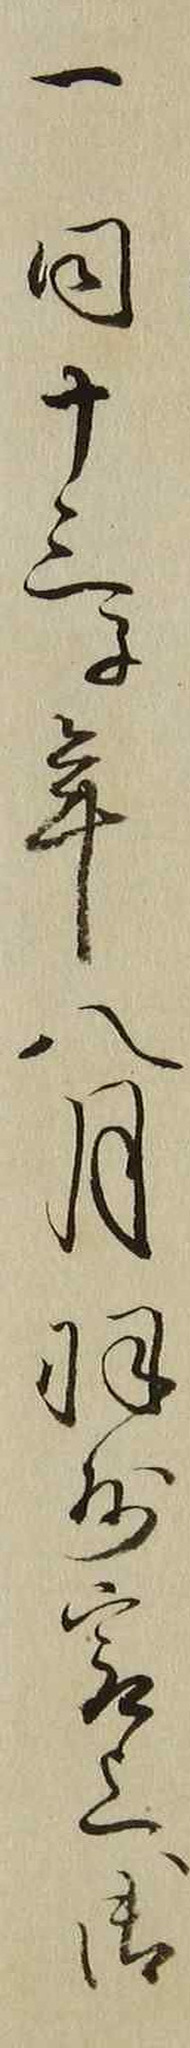一同十三子年八月羽州最上に御
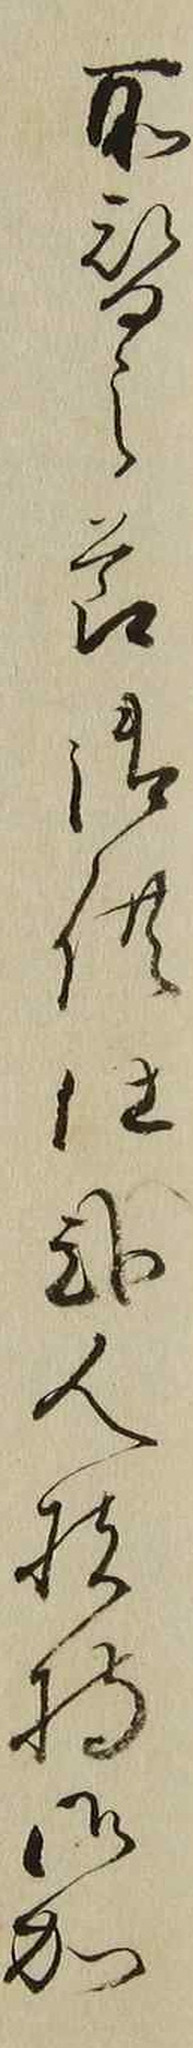所替の節御供仕弐人扶持御加
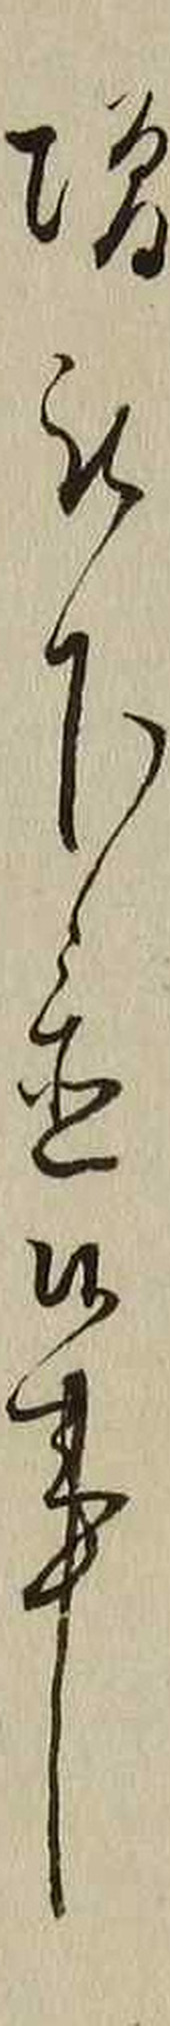増被下置候事
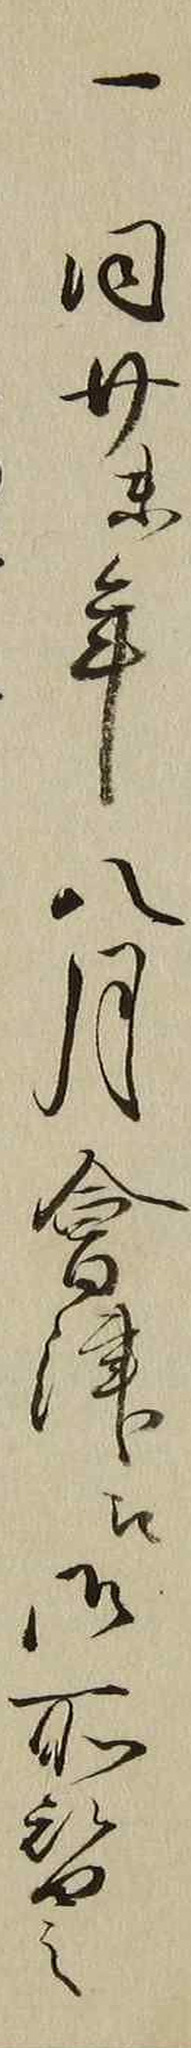一同廿未年八月会津江御所替の
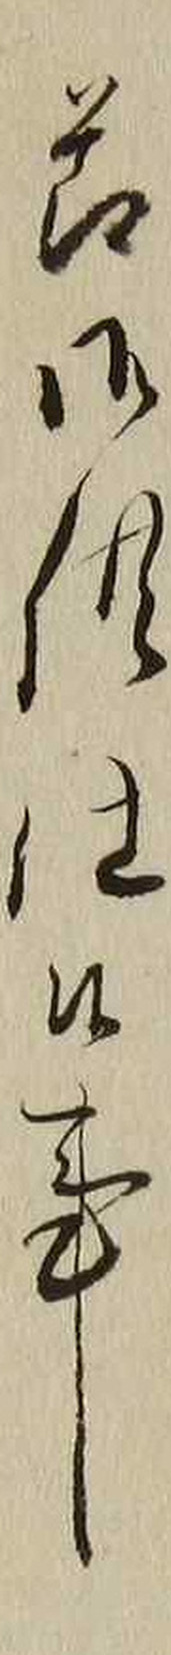節御供仕候事
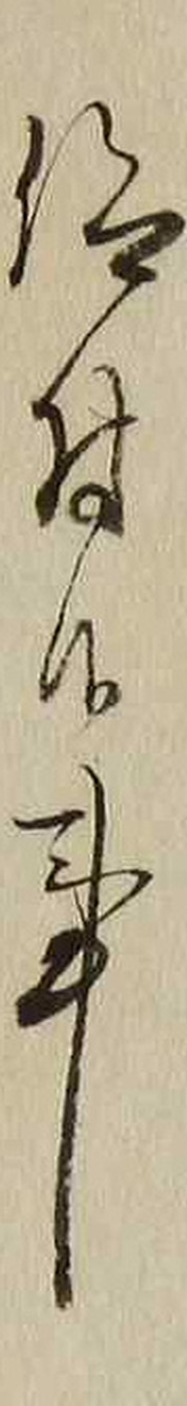仰付候事
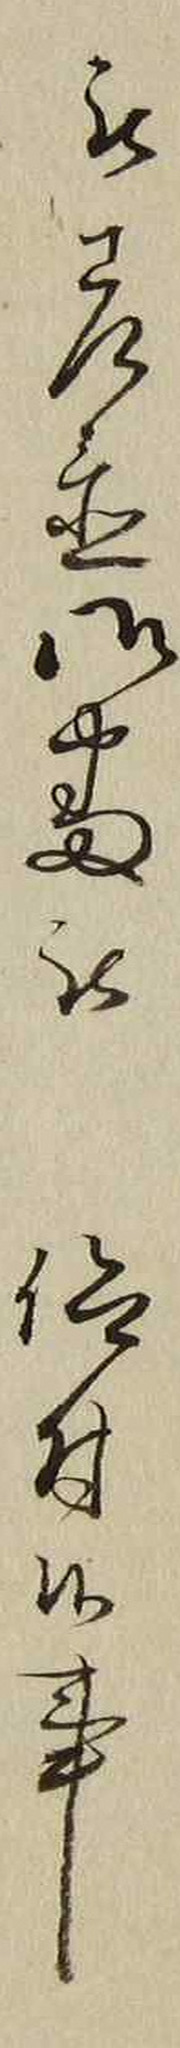被差置御番被仰付候事
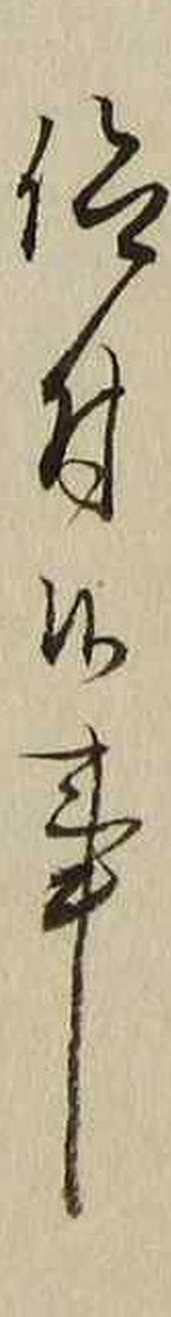仰付候事
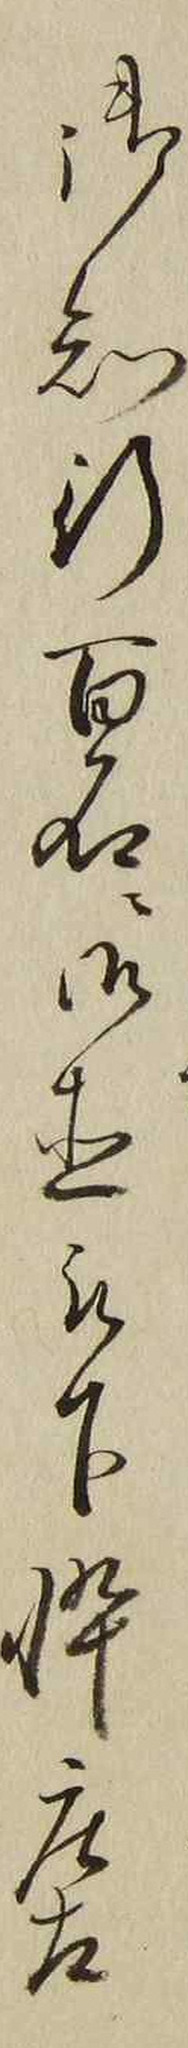御知行百石に御直被下忰庄左

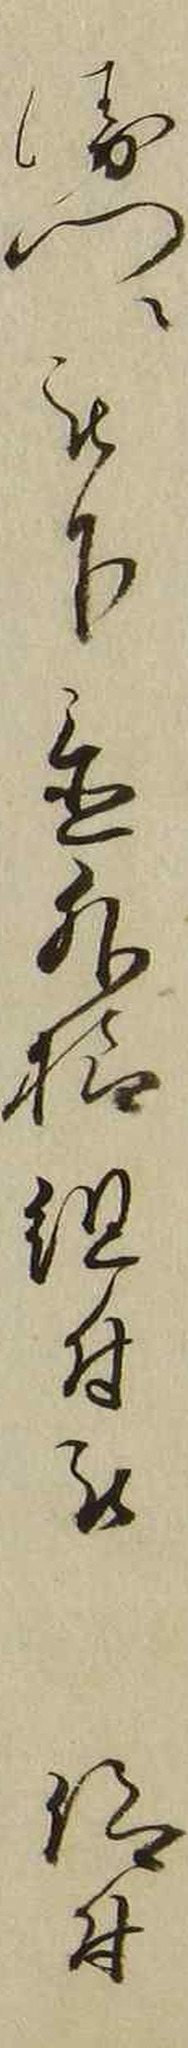衛門に被下置外様組付被仰付
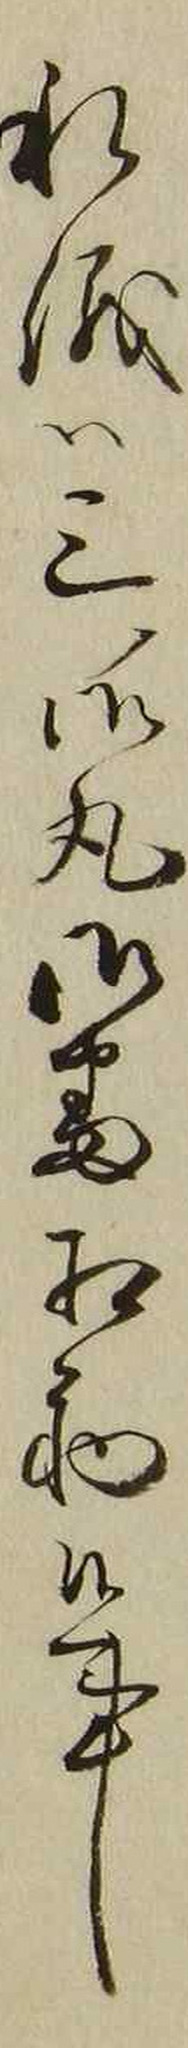私儀は三ノ御丸御番相勤候事
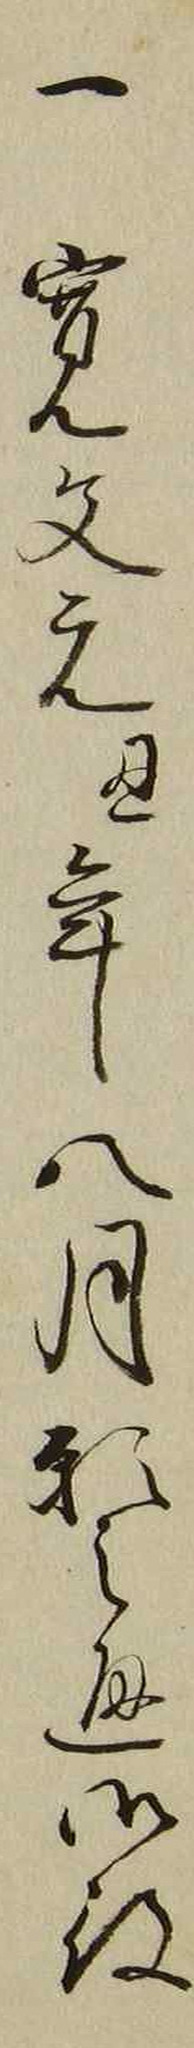一寛文元丑年八月願の通御役
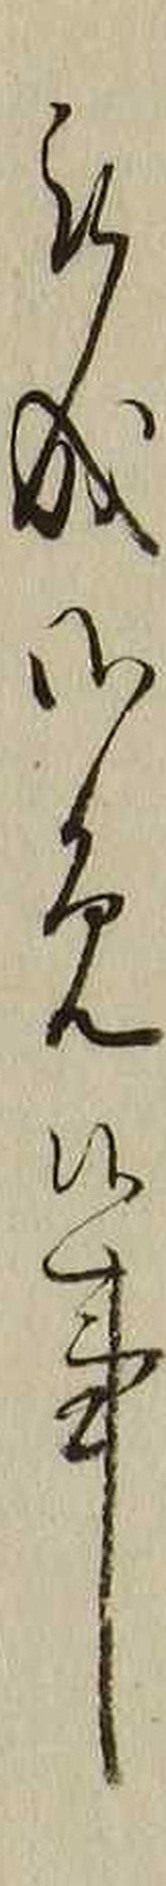被成御免候事
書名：諸士系譜　巻之1　い之部1
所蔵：会津若松市立会津図書館
